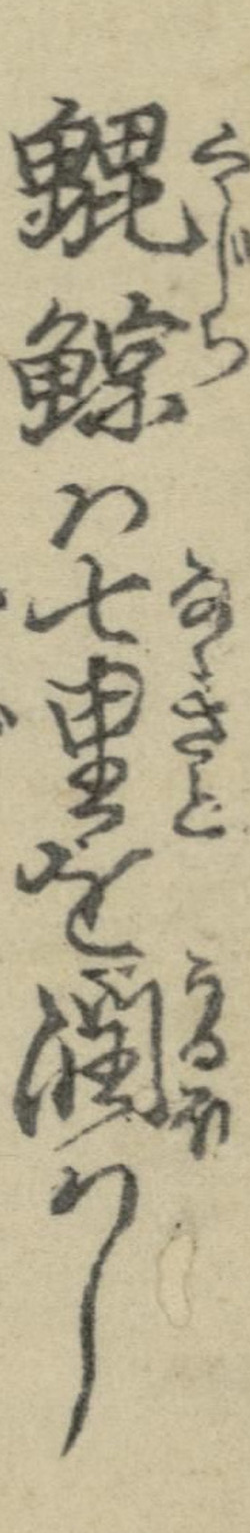鯤鯨は七里を潤はし
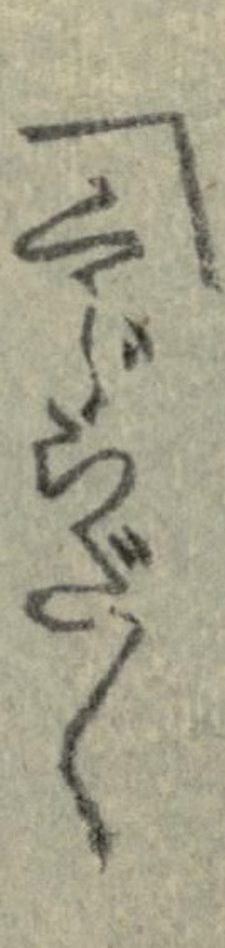〽くじらだ〳〵
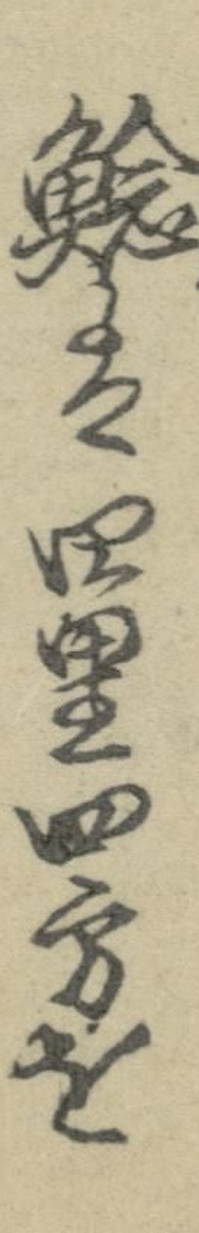鯰は四里四方を
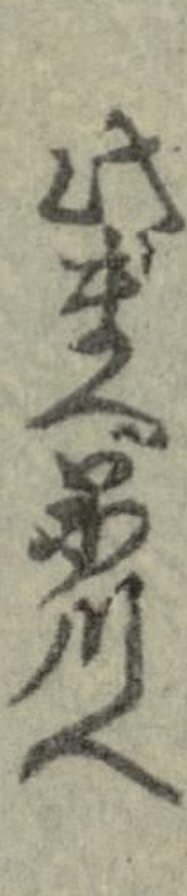此まへ品川へ
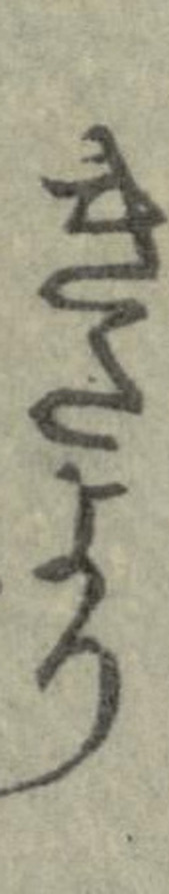きたより
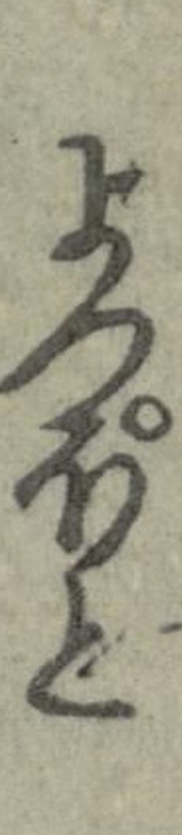よつぽと
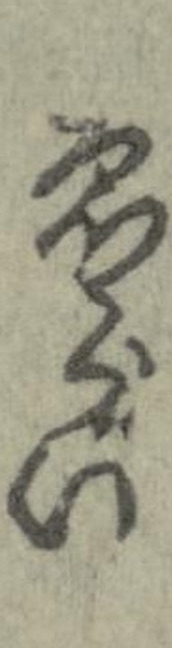ゑらい
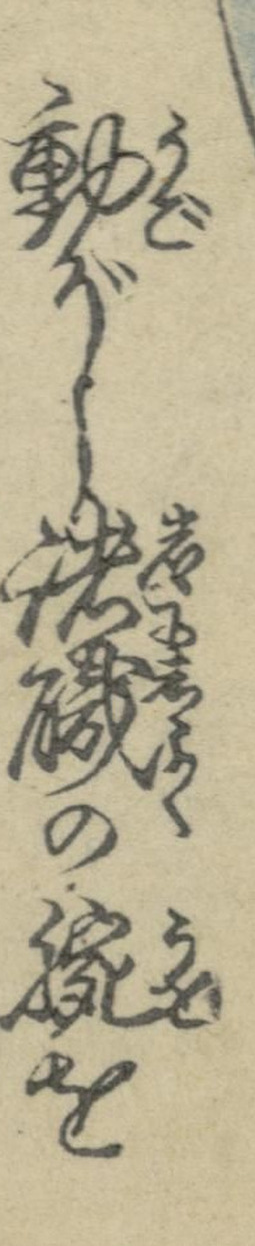動がし諸職の腕を
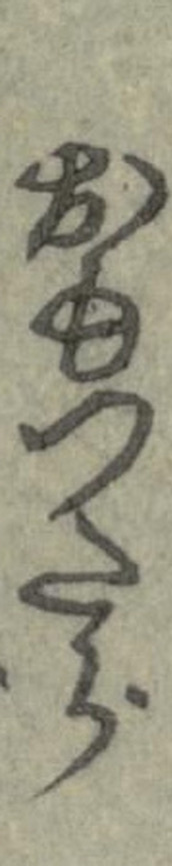おもつたら
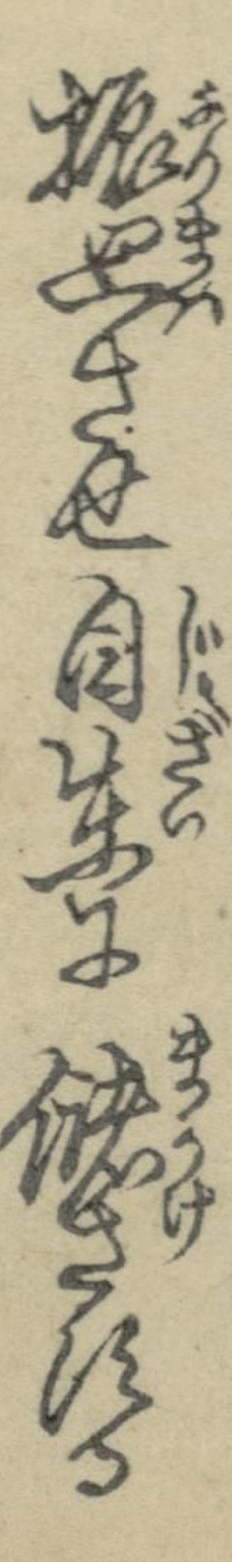賑廻させ自在に儲さする
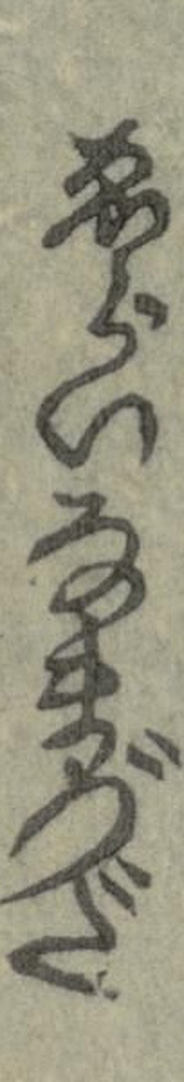ゑらいなまづだ
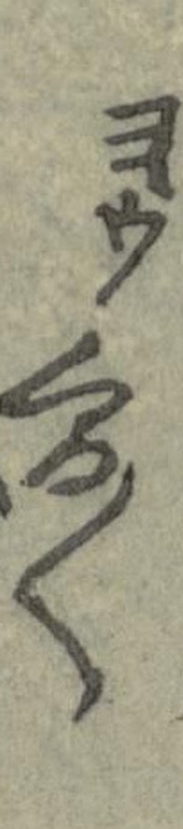ヨウくる〳〵
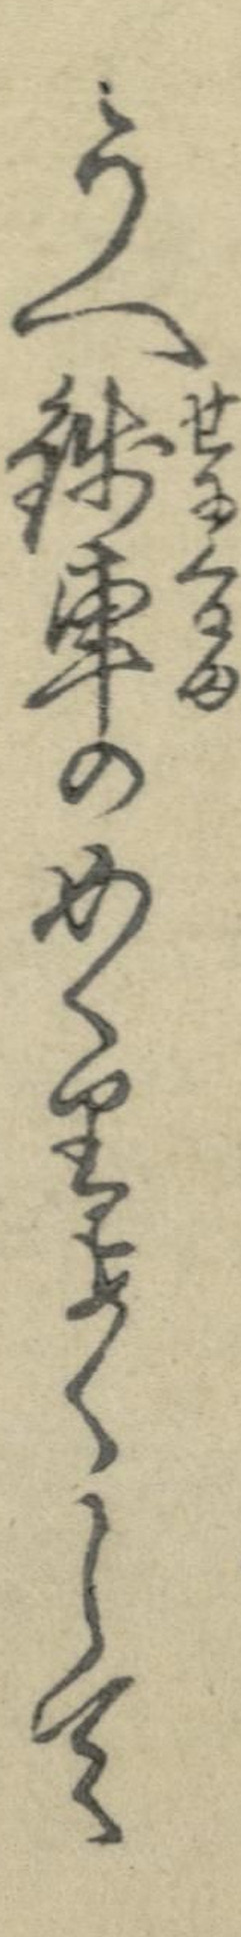うへ銭車のめくりよくして
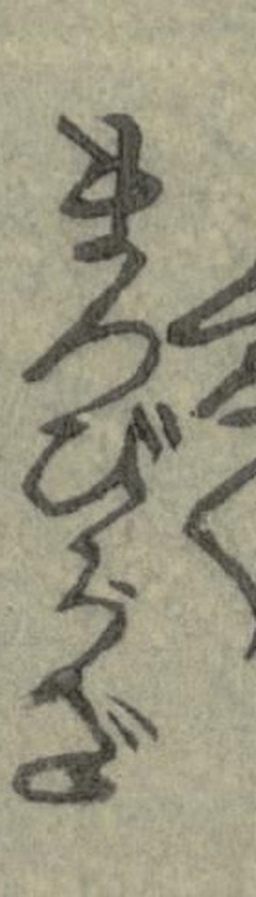まつびらだ
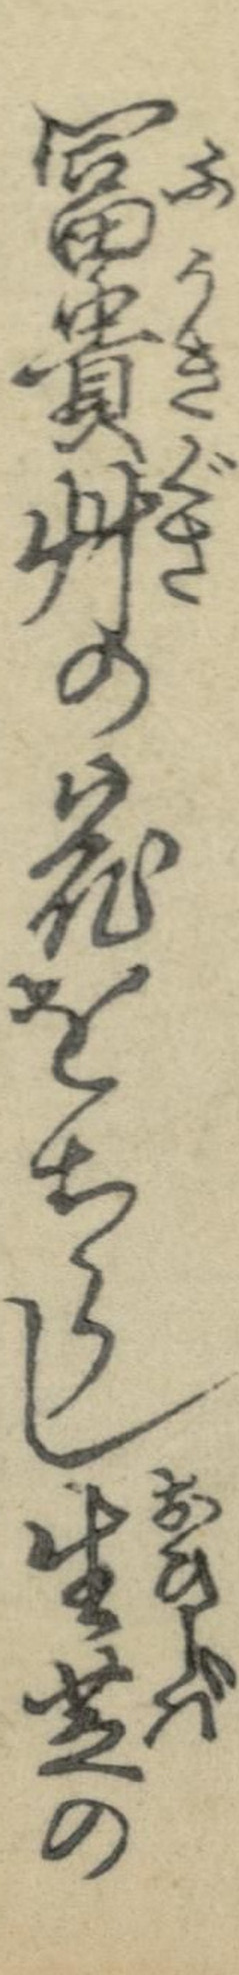富貴草の花をちらし生芝の
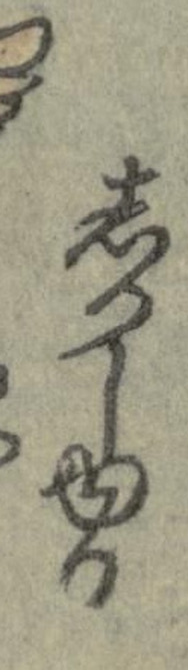しかしゆり
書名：大鯰江戸の賑ひ
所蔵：東京大学地震研究所図書室 Earthquake Research Institute Library, The University of Tokyo, JAPAN
